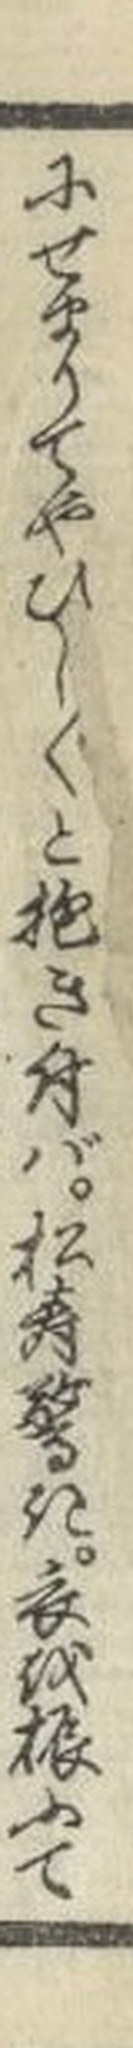にせまりてやひし〳〵と抱き付ば。松寿驚き。衣を振ふて
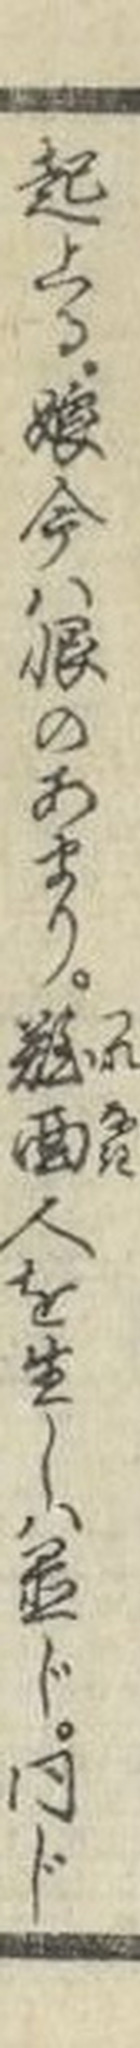起上る。娘今は恨のあまり。難面人を生しは置じ。同じ
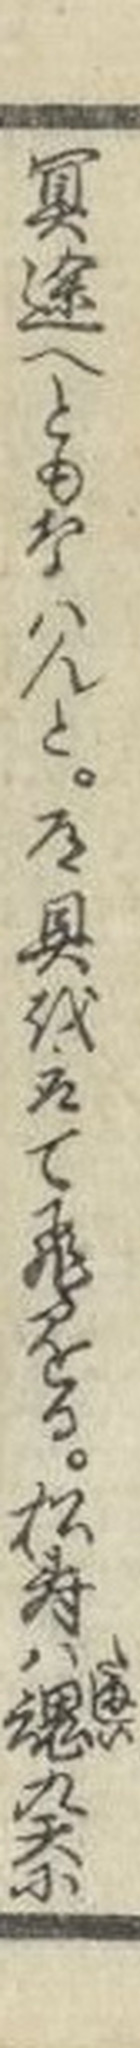冥途へともなはんと。道具を取て飛懸る。松寿は魂の天に
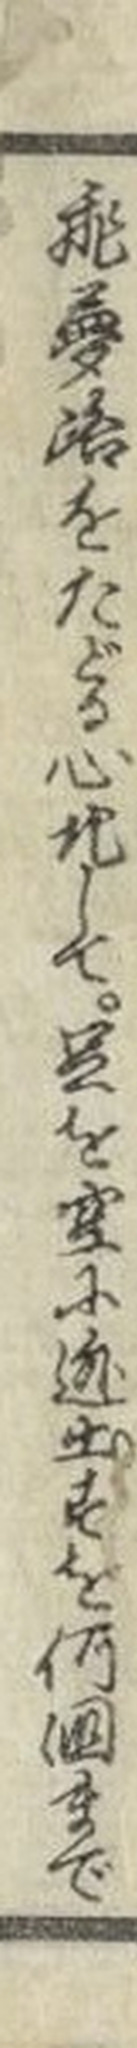飛夢路をたどる心地して。足を空に迯出すを何国まで
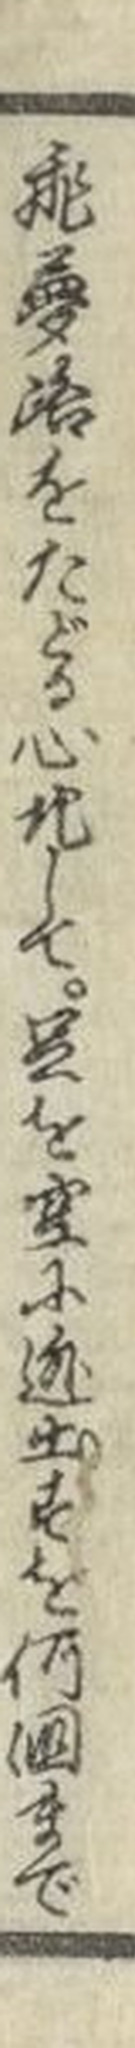飛夢路をたどる心地して。足を空に迯出すを何国まで
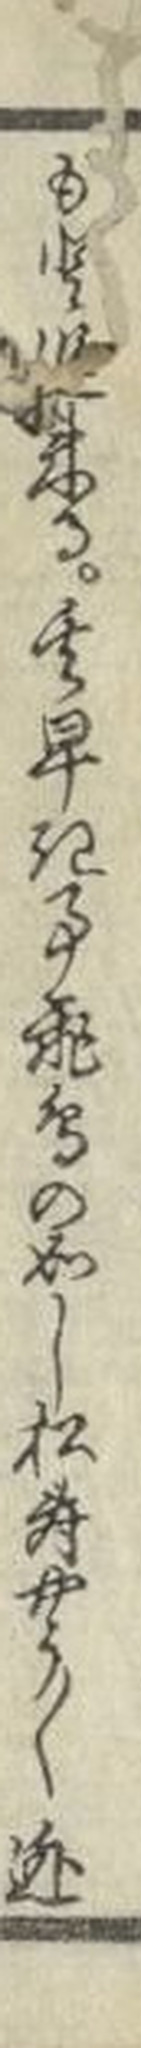も登来る。其早き事飛鳥の如し松寿やう〳〵迯
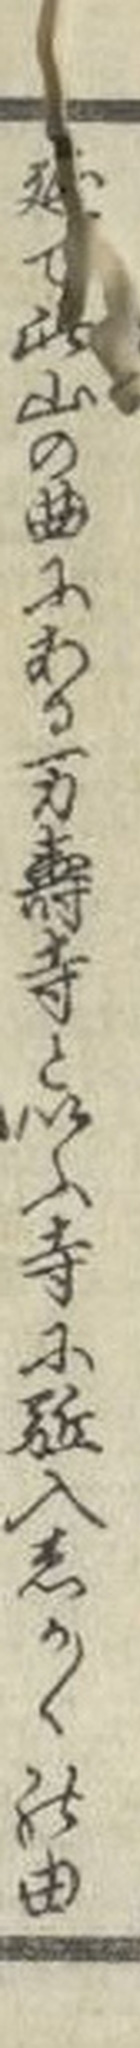延て此山の曲にある万寿寺といふ寺に駈入しか〳〵の由
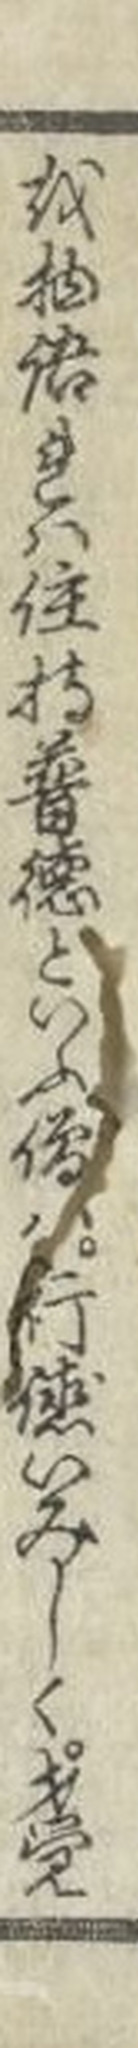を物語れは住持普徳といふ僧は。行徳いみしく。才覚
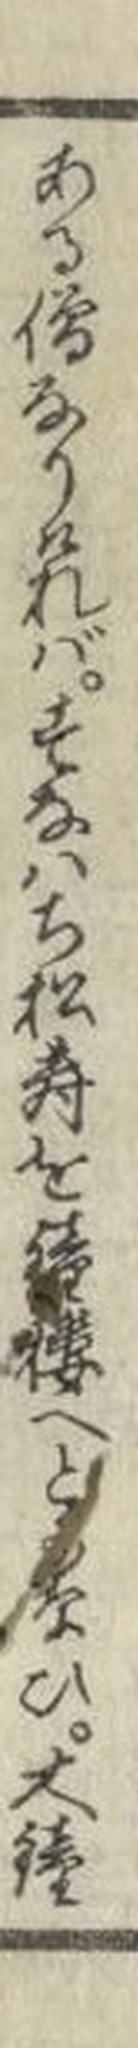ある僧なりければ。すなはち松寿を鐘楼へともなひ。大鐘
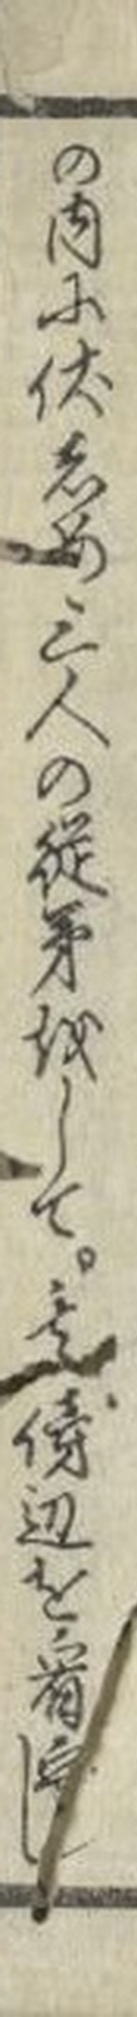の内に伏しめ三人の従弟をして。其辺を看守し

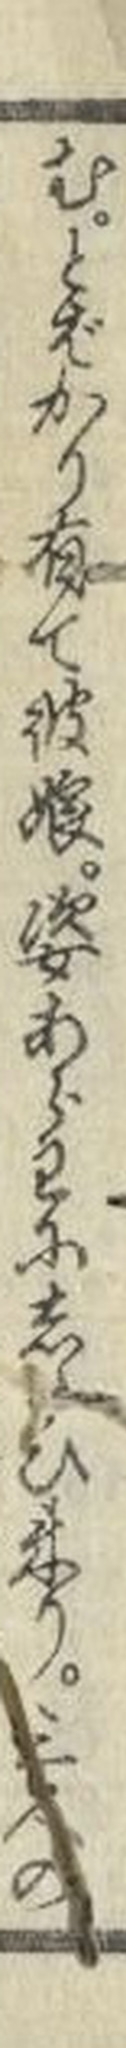む。とばかり有て彼娘。姿あらわにしひ来り。三人の
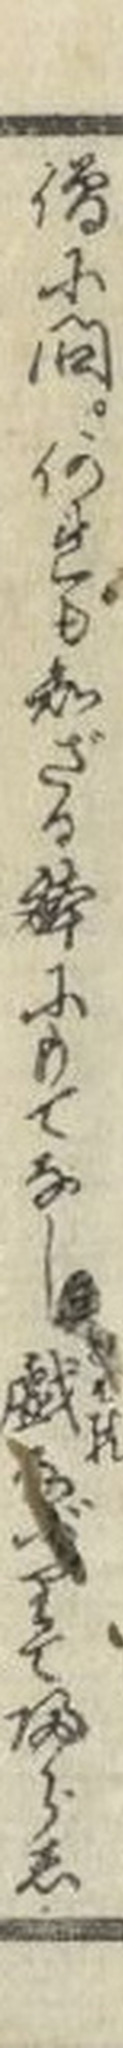僧に問。何れも知ざる躰にもてなし戯なぶりて帰らし
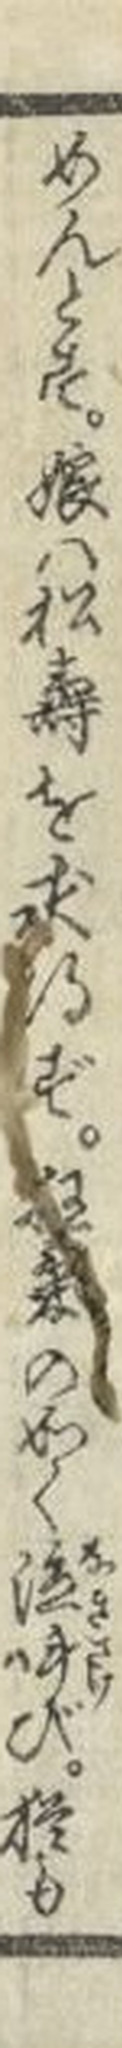めんとす。娘は松寿を求得ず。狂の如く泣叫び。猶も
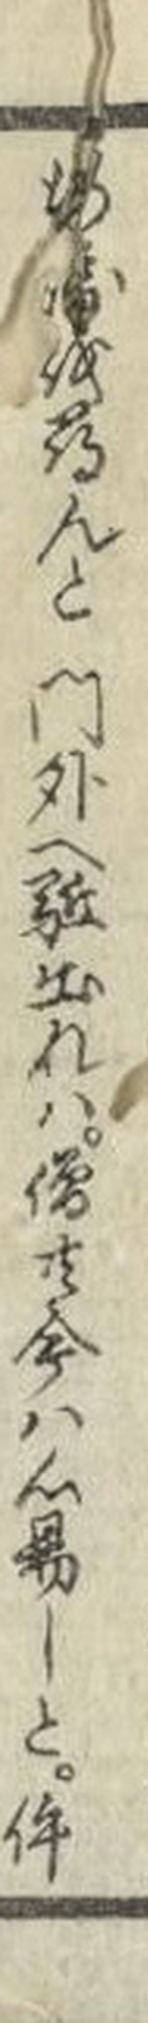を尋んと門外へ駈出れは。僧共今は心易しと。件
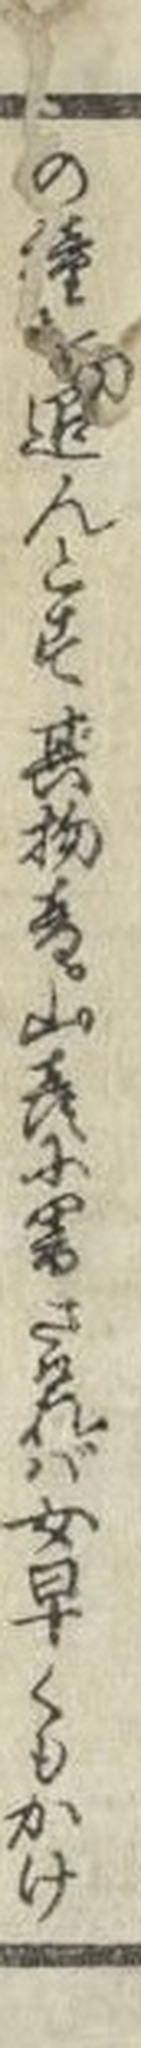の鐘を追んとす其物音。山彦にさければ女早くもかけ
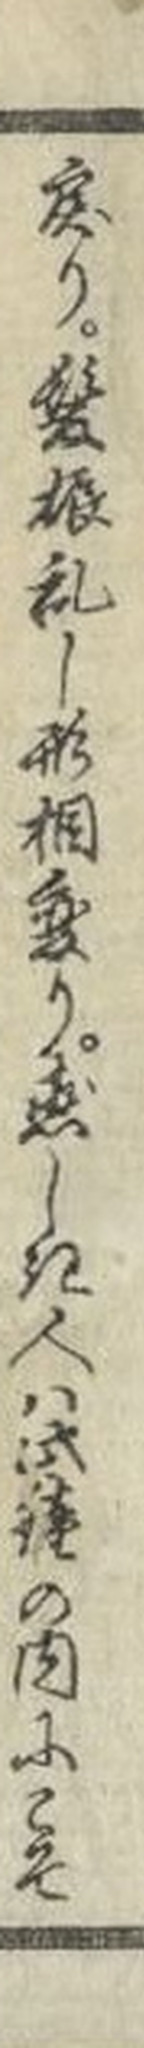戻り。髪振乱し形相変り。恋しき人は此鐘の内にこそ
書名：琉球解語
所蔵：University of the Ryukyus Library
